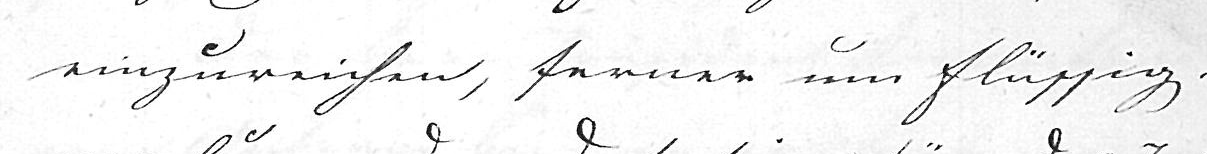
einzureichen, ferner um Flüssig-
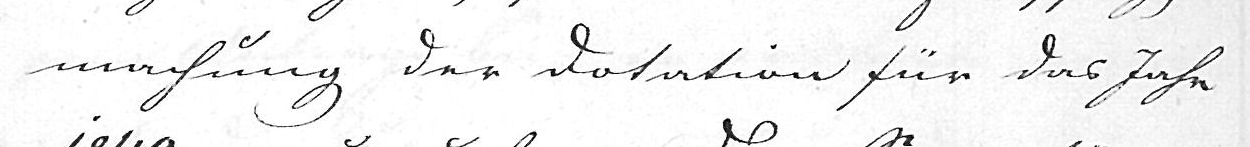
machung der Dotation für das Jahre
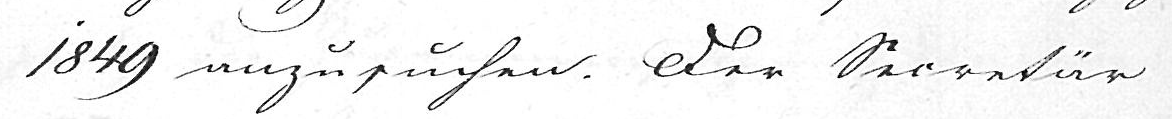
1849 anzusuchen. Der Secretär
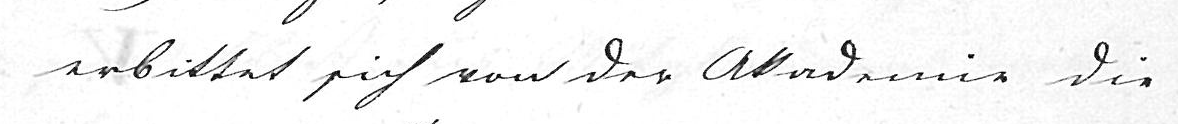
erbittet sich von der Akademie die
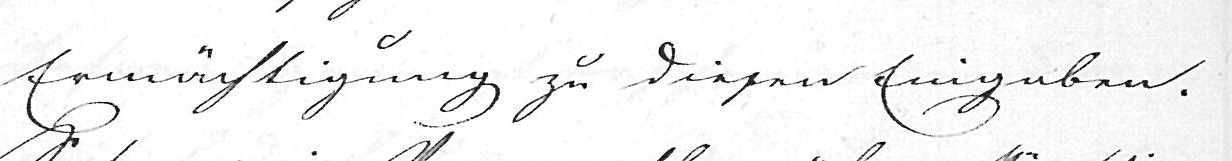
Ermächtigung zu diesen Eingaben.
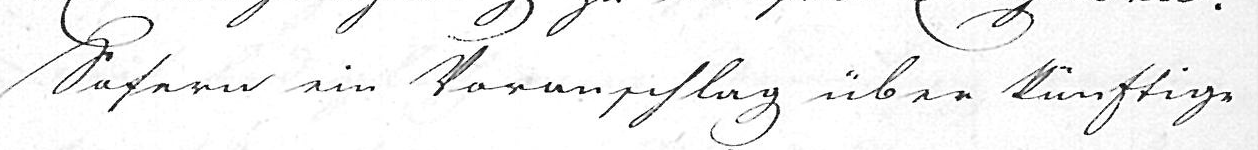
Sofern ein Voranschlag über künftige
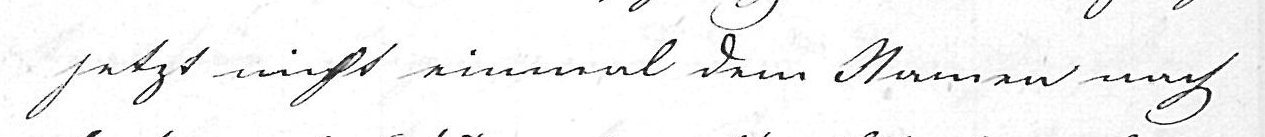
jetzt nicht einmal dem Namen nach
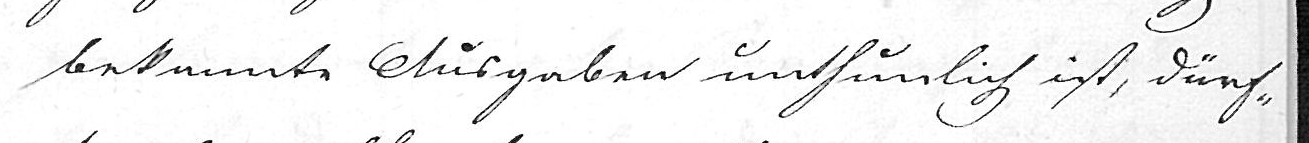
bekannte Ausgaben unthunlich ist, dürf-
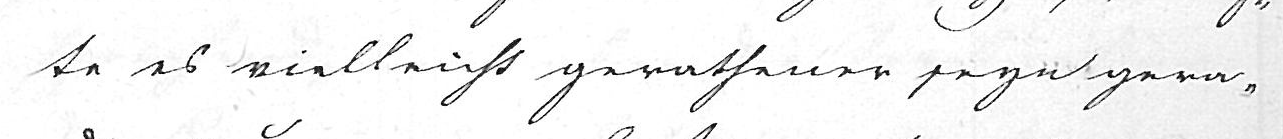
te es vielleicht gerathener seyn gera-
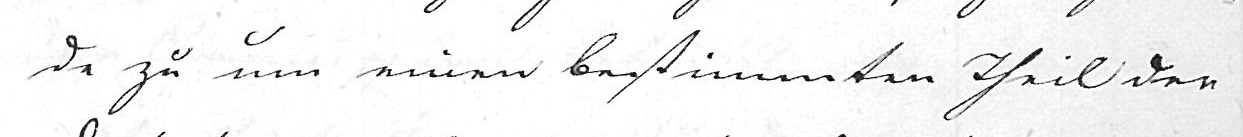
de zu um einen bestimmten Theil der
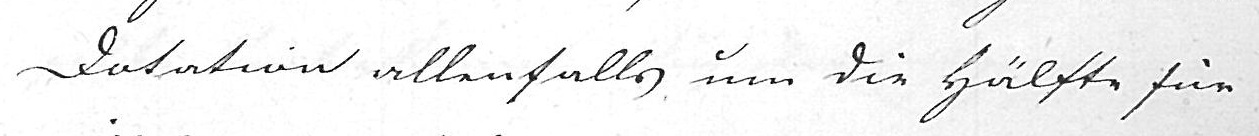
Dotation allenfalls um die Hälfte für
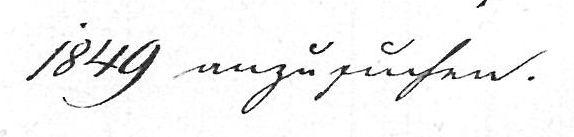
1849 anzusuchen.
